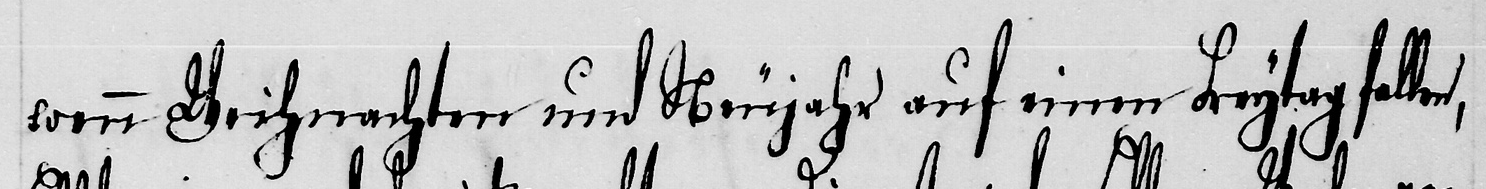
wenn Weihnachten und Neujahr auf einen Freytag falle¬
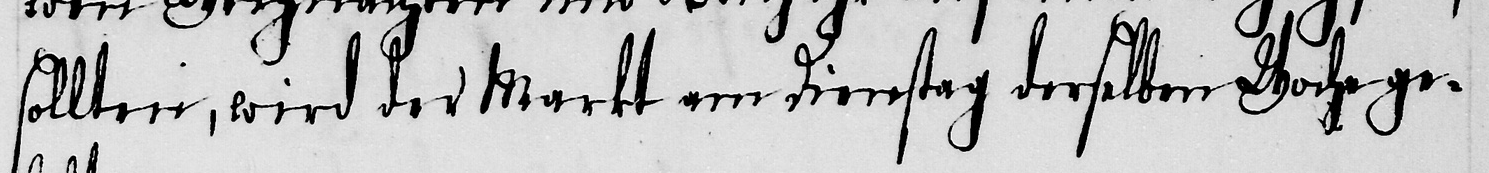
sollten, wird der Markt am Dienstag derselben Woche ge¬
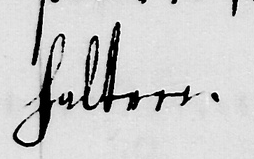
halten.
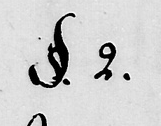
§.2.
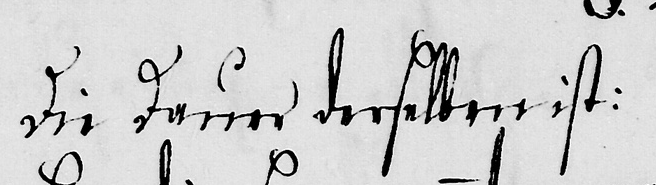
Die Dauer derselben ist:
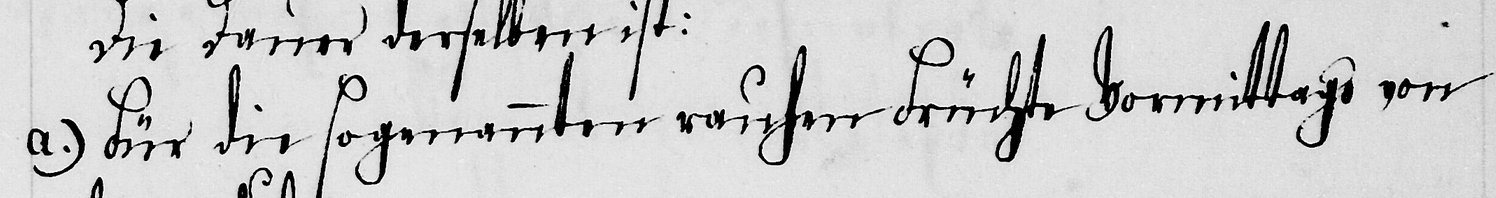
a.) Für die sogenannten rauhen Früchte Vormittags von
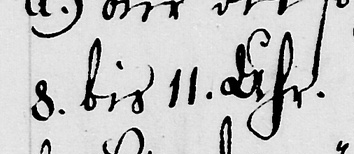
8. bis 11. Uhr.
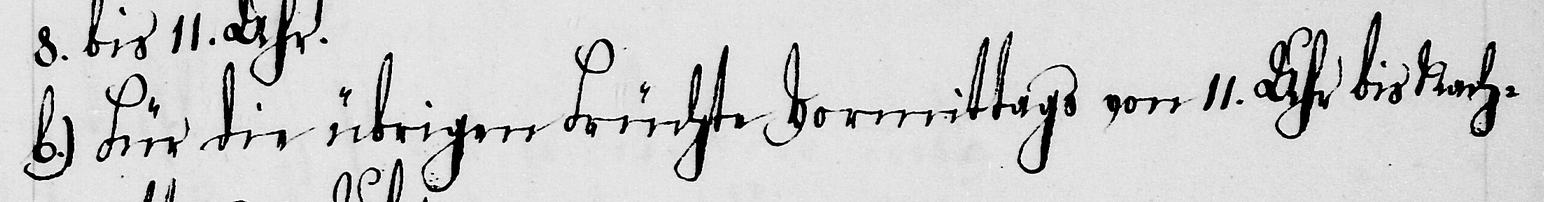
b.) Für die übrigen Früchte Vormittags von 11. Uhr
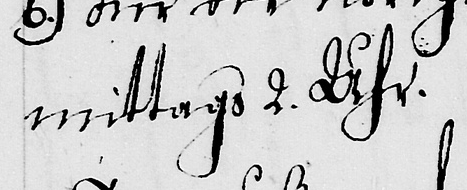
mittags 2. Uhr.
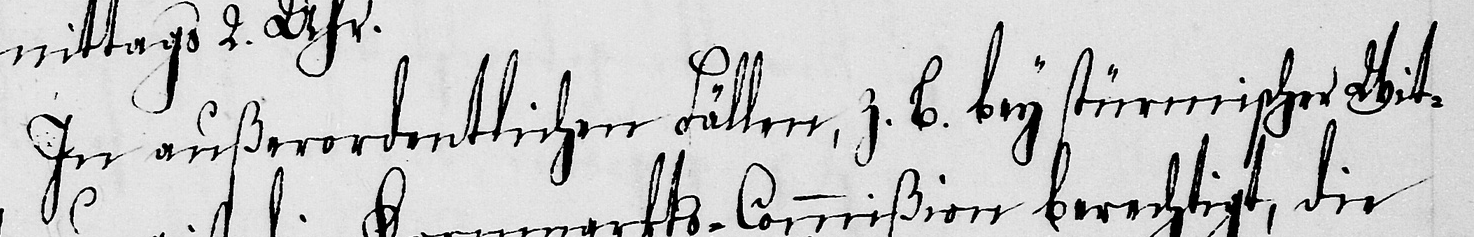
In außerordentlichen Fällen, z. B. bey stürmischer Wit¬
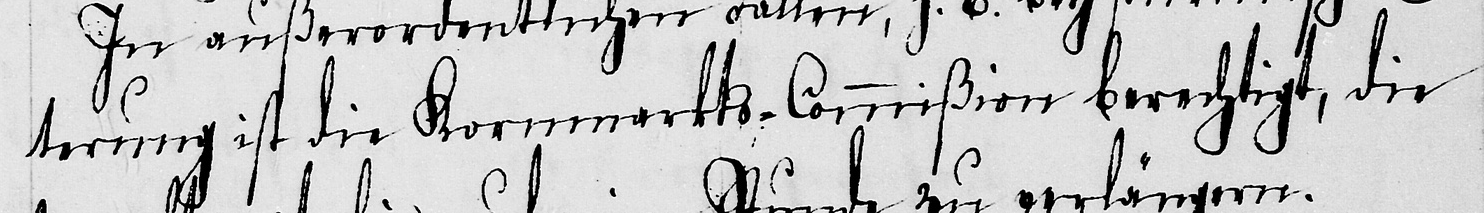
terung ist die Kornmarkts-Commißion berechtigt, die
